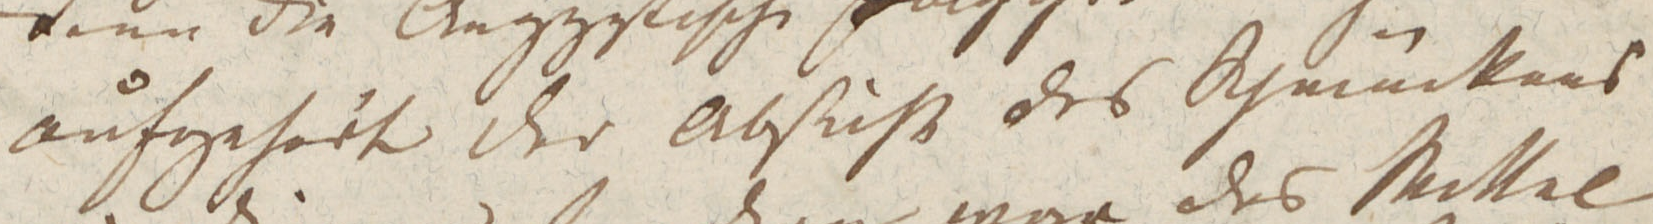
aufgehört der Absicht des Schmückens
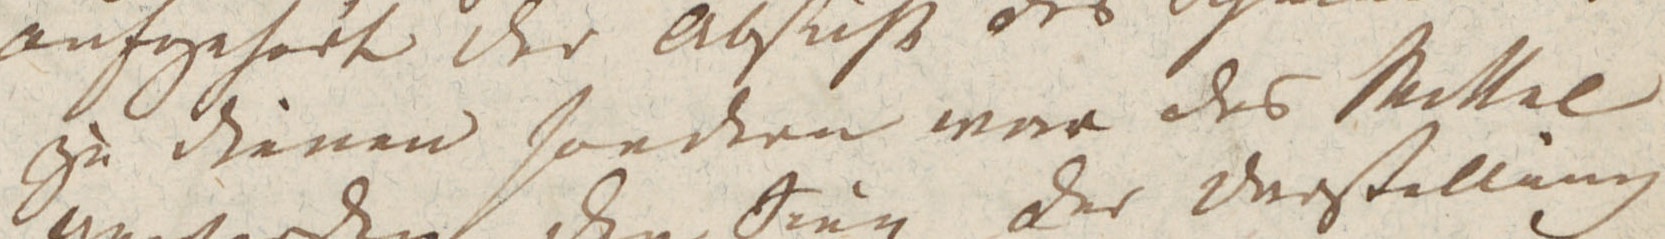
zu dienen sondern war das Mittel
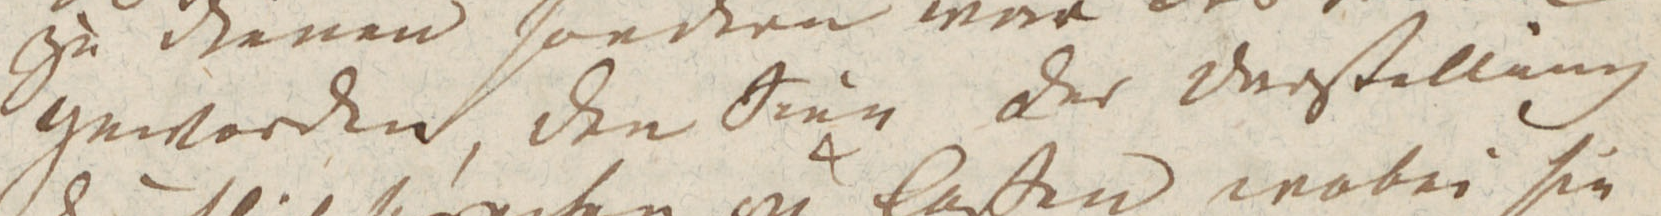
geworden, den Sinn der Darstellung
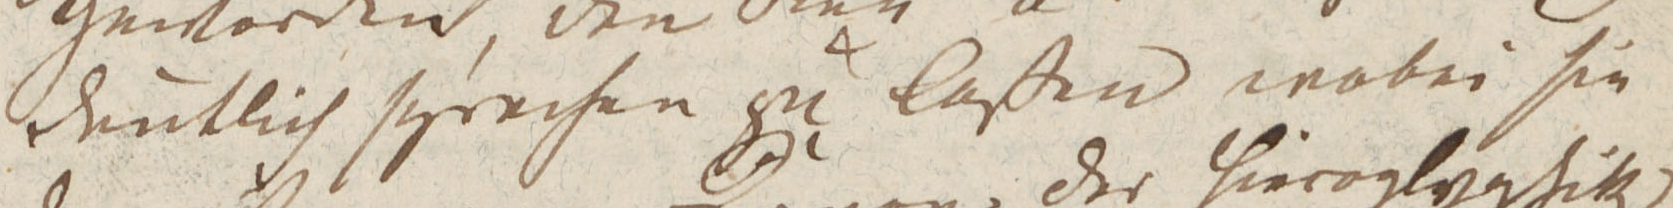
deutlich sprechen zu lassen wobei sie
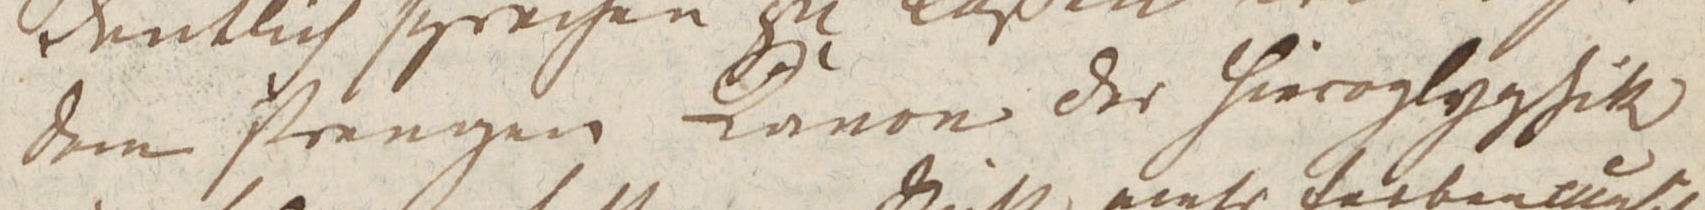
dem strengen Kanon der Hieroglyphik
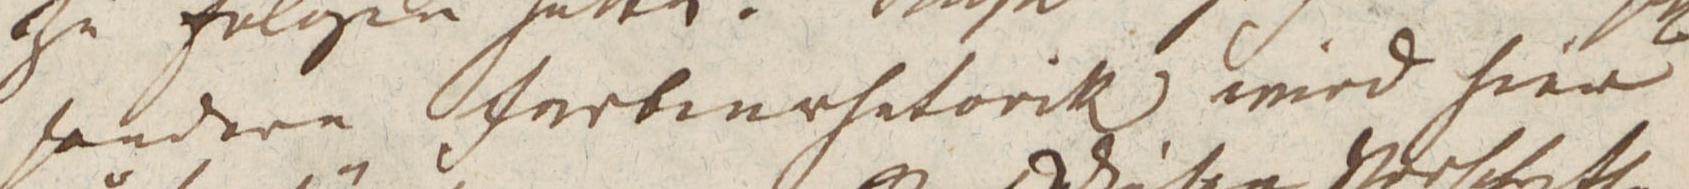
sondern Farbenrhetorik wird hier
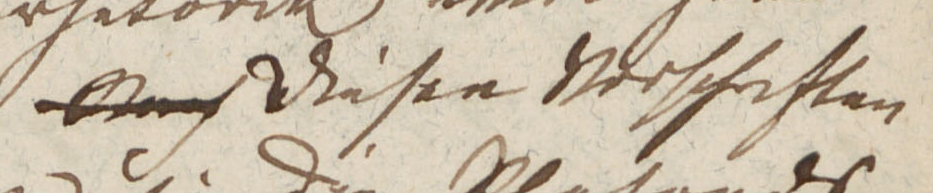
Nach dDiesen Vorschriften
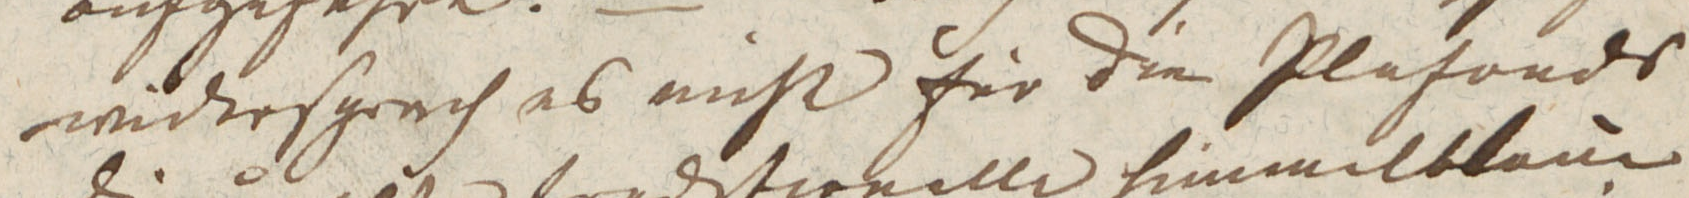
widersprach es nicht für die Plafonds
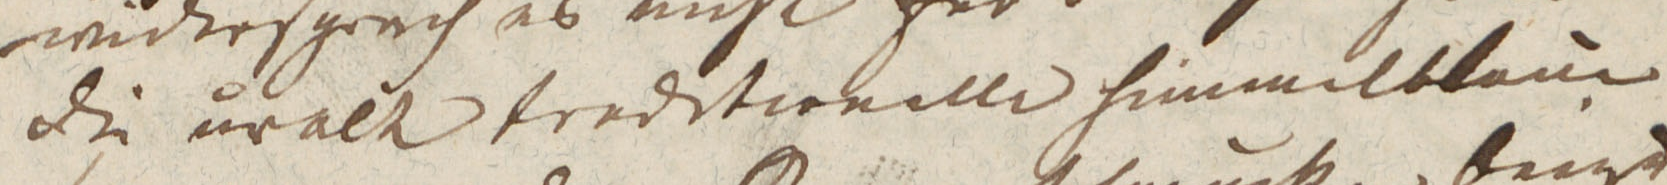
die uralt traditionelle himmelblaue
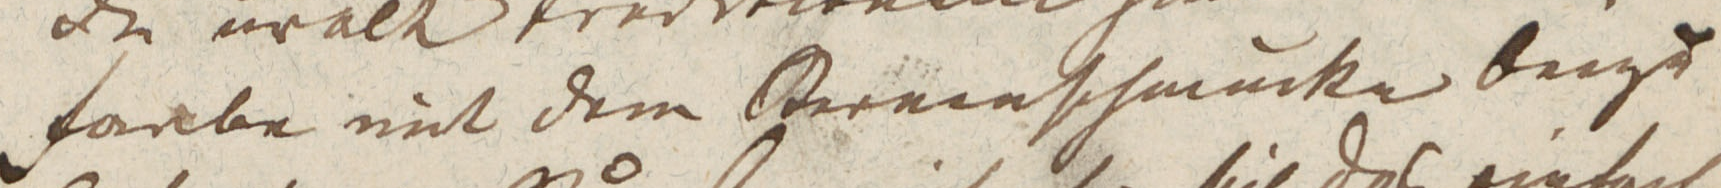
Farbe mit dem Sternenschmucke beizu
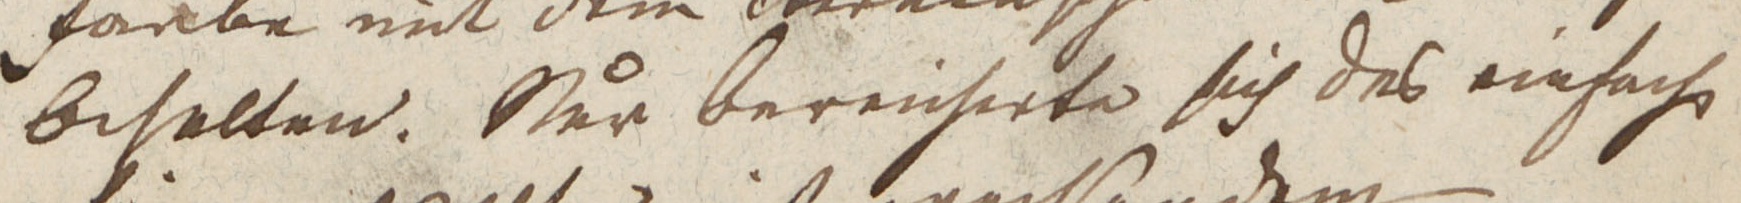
behalten. Nur bereicherte sich das einfache
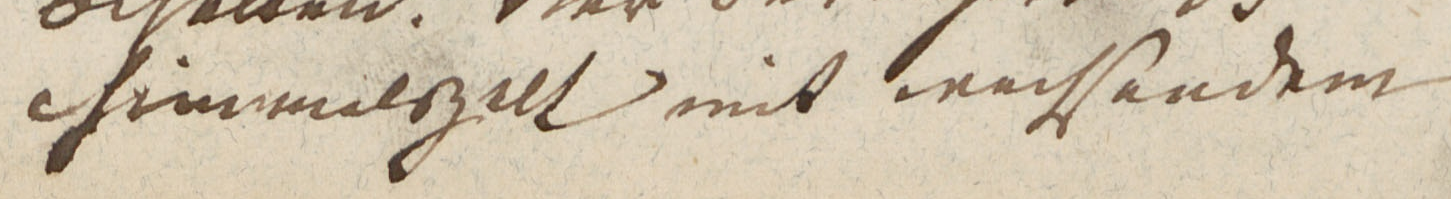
Himmelszelt mit wachsendem
